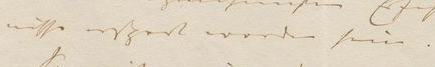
nisse erspart worden sein.
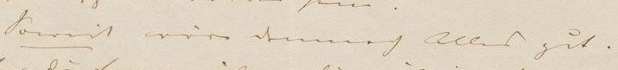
Soweit wäre demnach Alles gut.
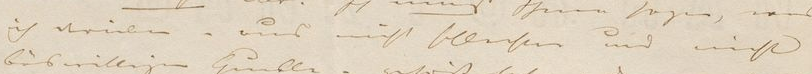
ich darüber – aus nicht schlechter und nicht
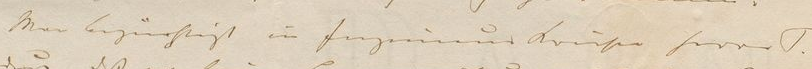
Man bezichtigt in Ingenieurkreisen Herrn T.
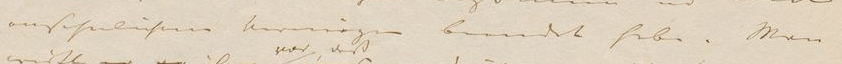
ansehnlichem Vermögen beendet habe. Man
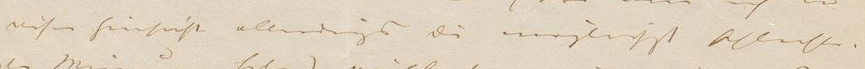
dieser Hinsicht allerdings die möglichst schlechte-
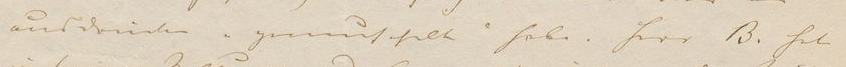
ausdrücken «gemauschelt» habe. Herr B. hat
